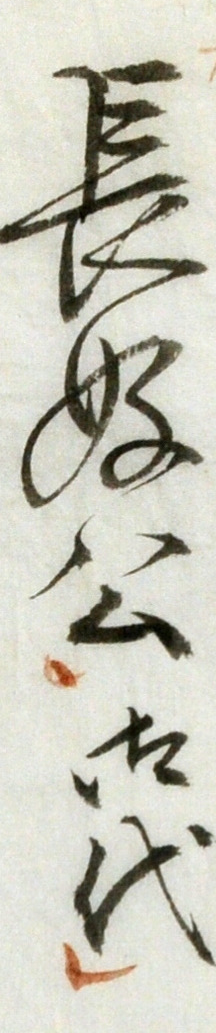長好公御代
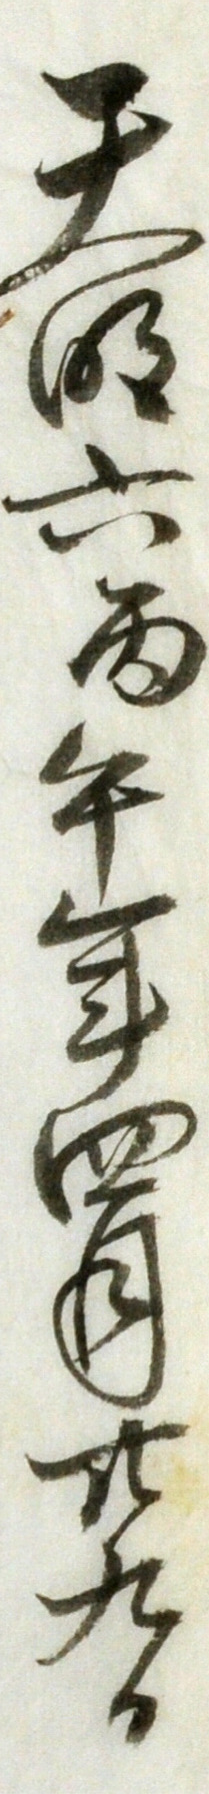天明六丙午年四月廿九日
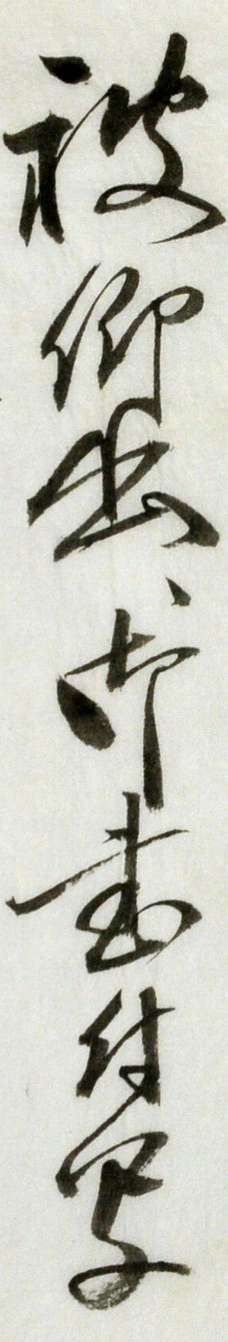被仰出候御書付写

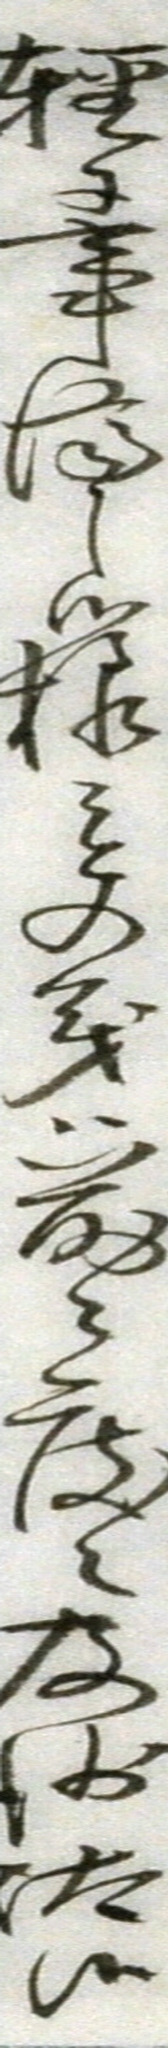軽に事済し候様ニとの義ハ前々度々及沙汰候
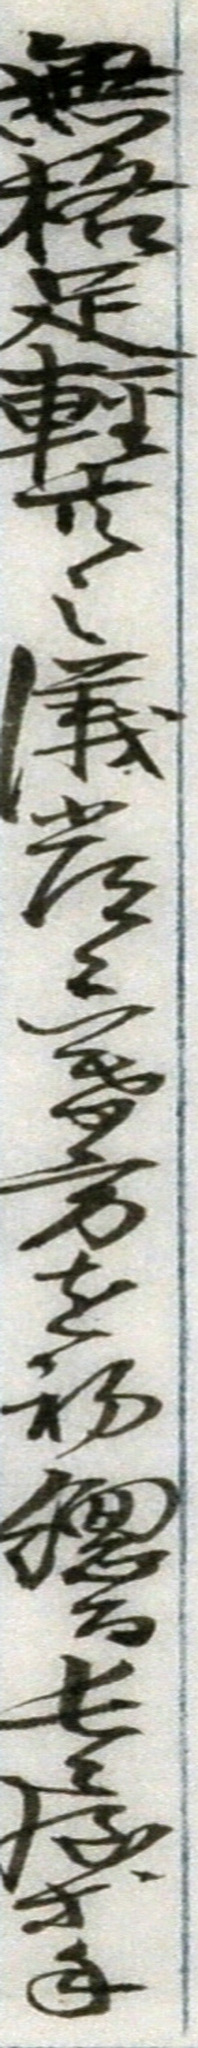無格足軽共之儀常々暮方を初総而長屋等手
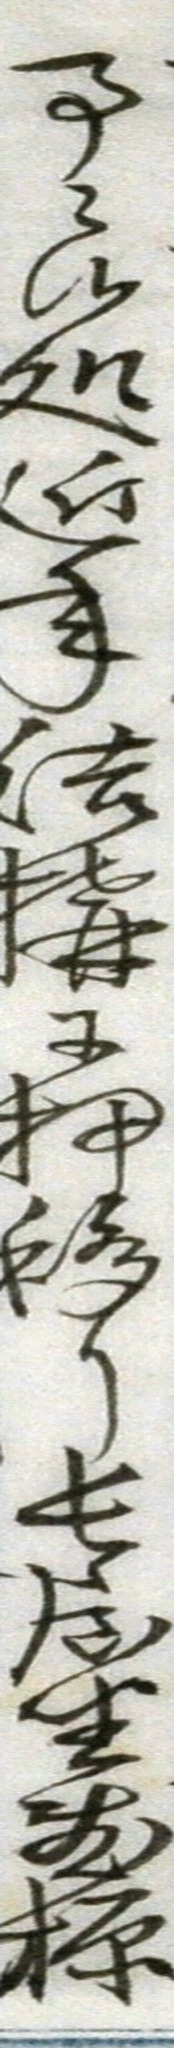事ニ候処近年結構に押移り長屋坐敷様
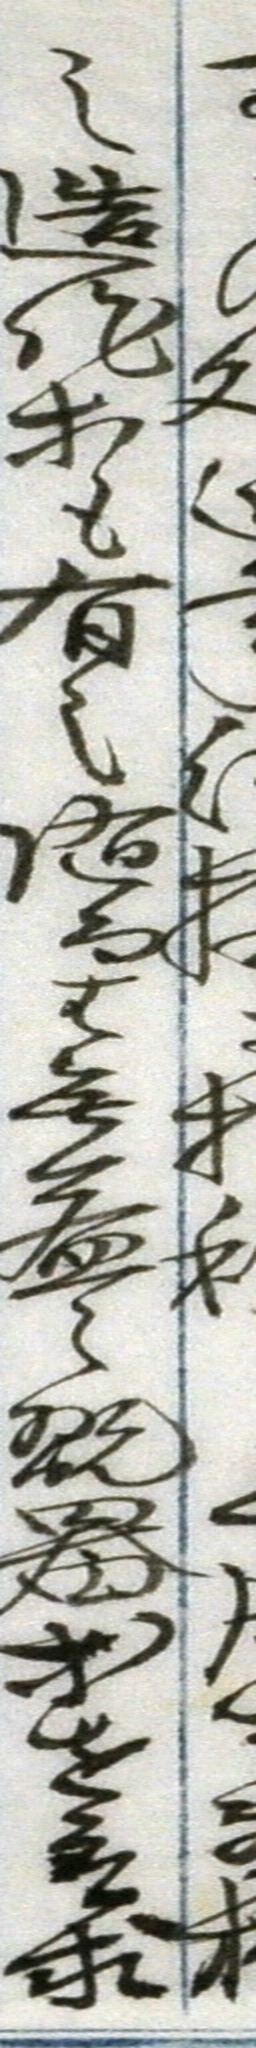之造作等も有之随而は無益之翫器等を取求
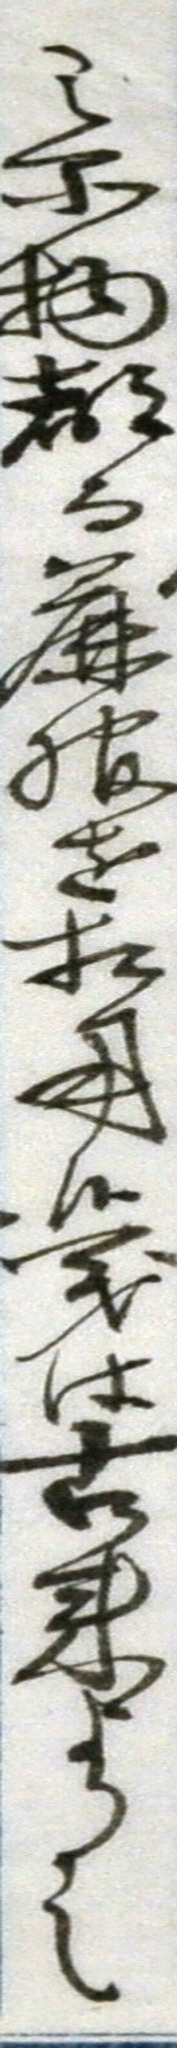之品物都而麁服を相用候義は古来より之
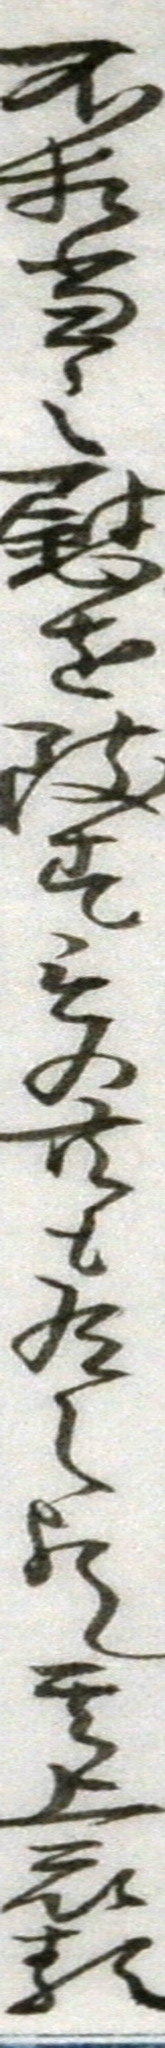不相当之慰を致すもの共も有之よし其上衣類
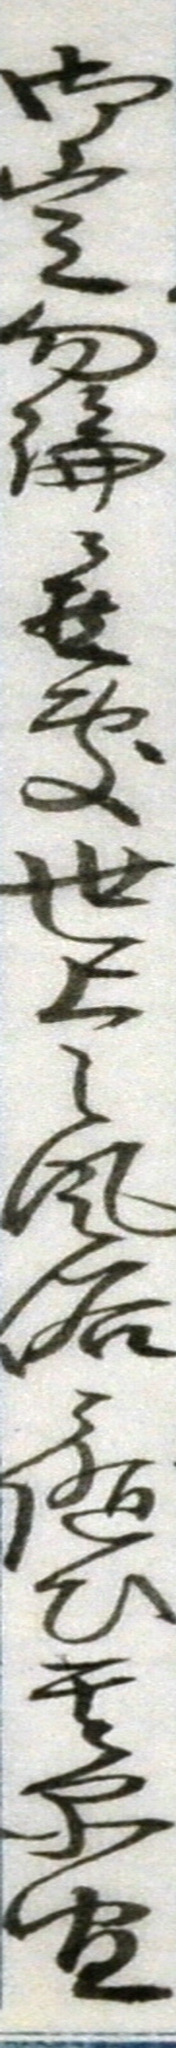御定勿論ニ侯処世上之風俗ニ随ひ其品宜
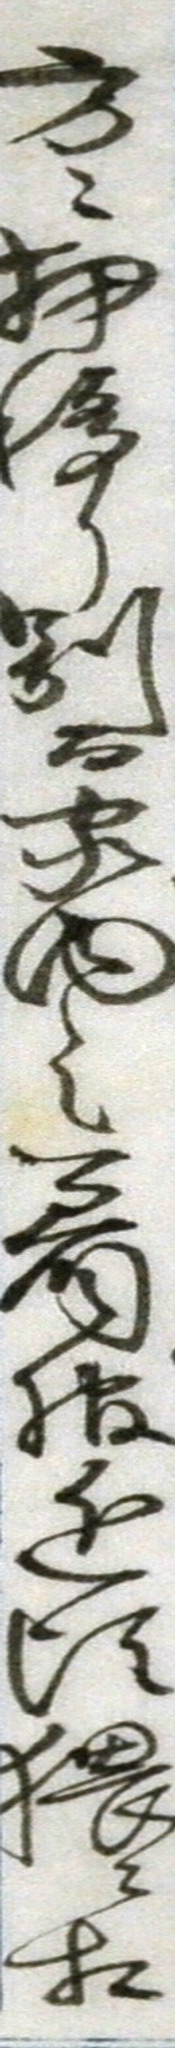方ニ押移り別而家内之着服近頃猥ニ相
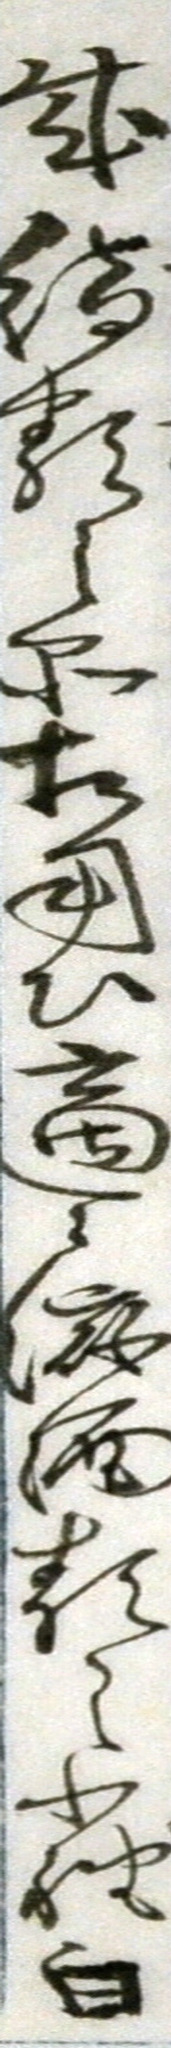成絹類之品相用ひ適ニ縮緬類之小袖白
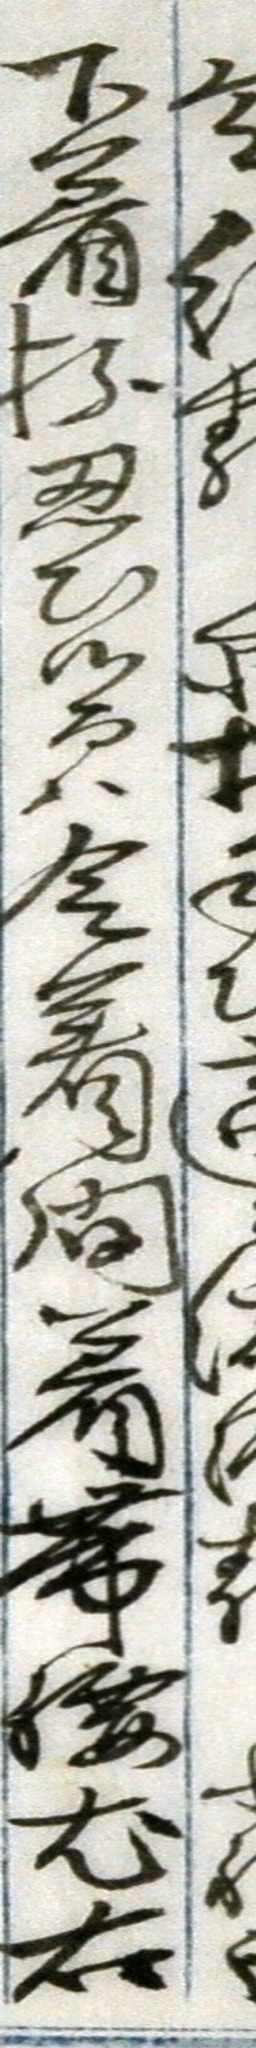下着抔忍ひ候而ハ合着間着帯腰尤右
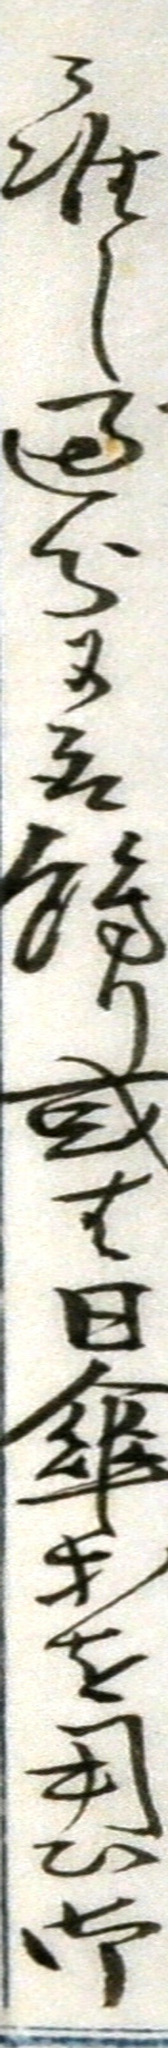ニ准し過分に取飾り或は日傘等を用ひ御

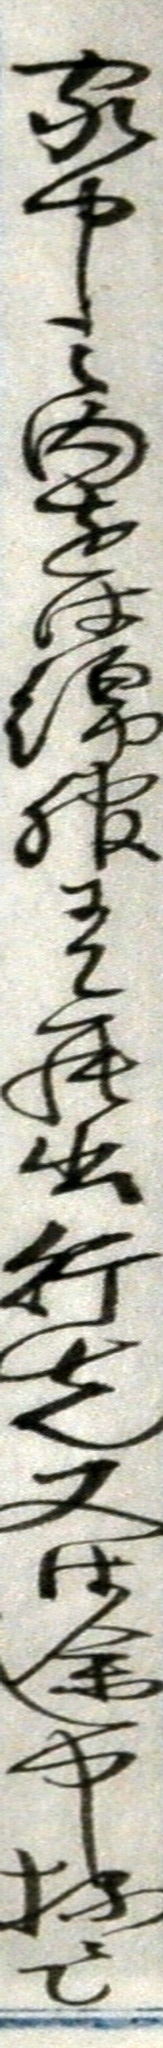家中之内をは綿服にて罷出行先又は途中抔ニて
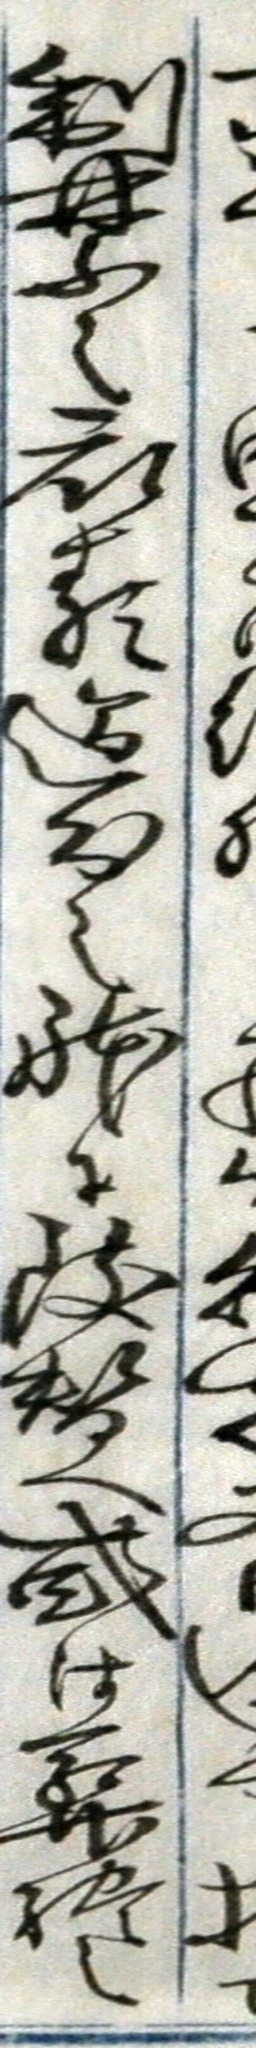制禁之衣類過分之体に致替へ或は葬礼之
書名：長好公御代被仰出御書付（写）
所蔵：伊那市立高遠町図書館・合同会社AMANE
